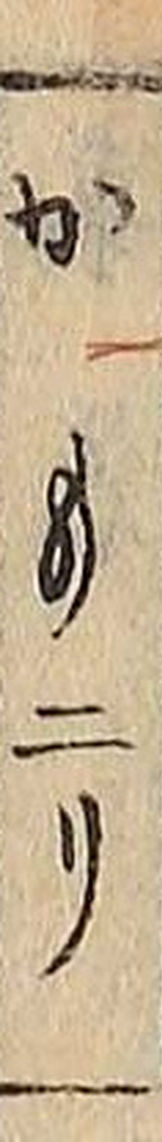かも二リ
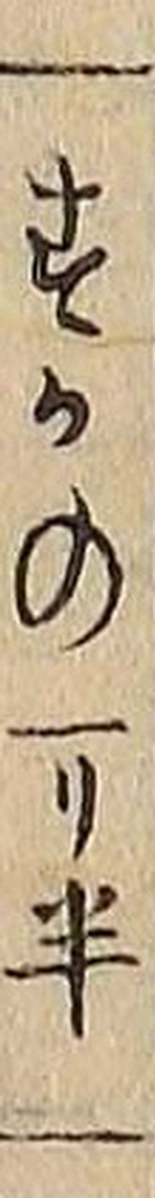すかの一リ半
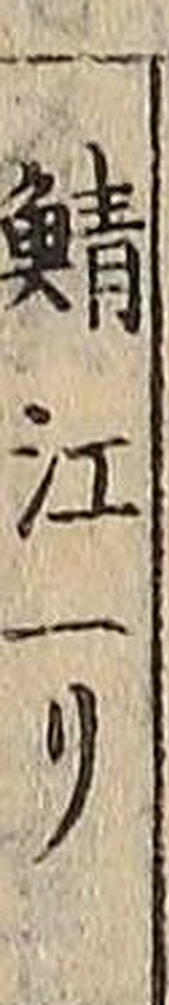鯖江一リ
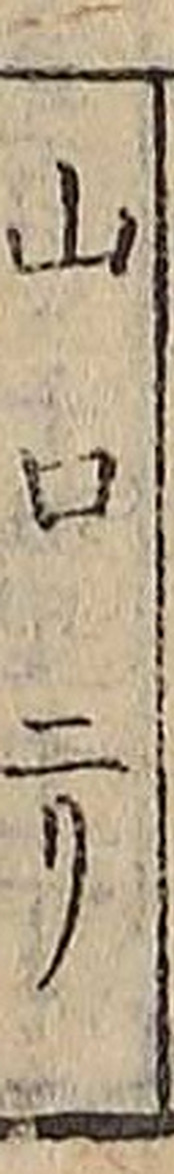山口二リ
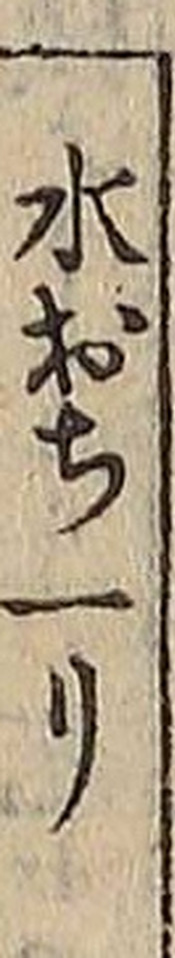水おち一リ
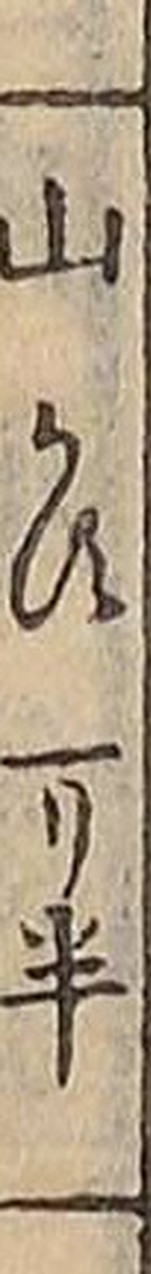山かす一リ半
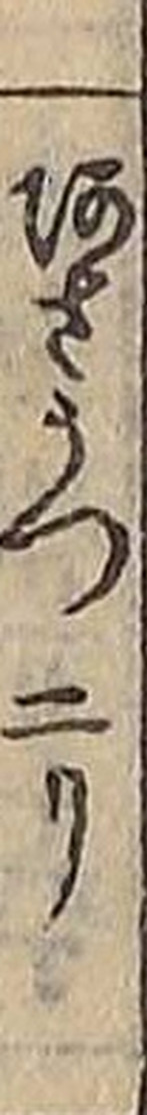あさうつ二り
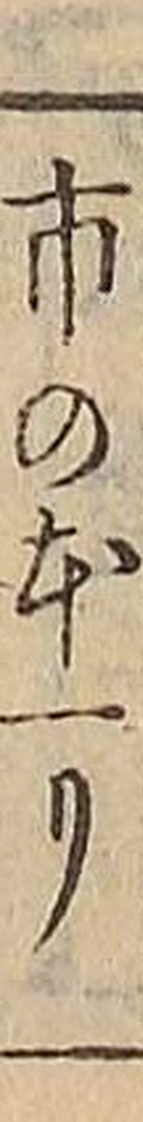市の本一リ
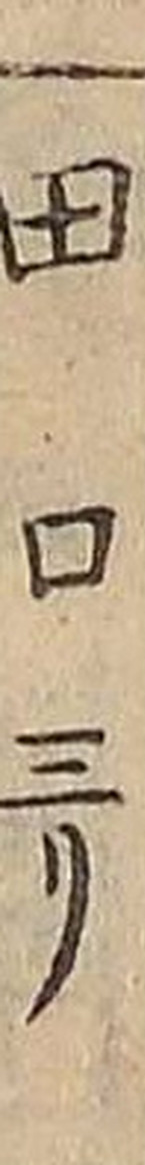田口三リ
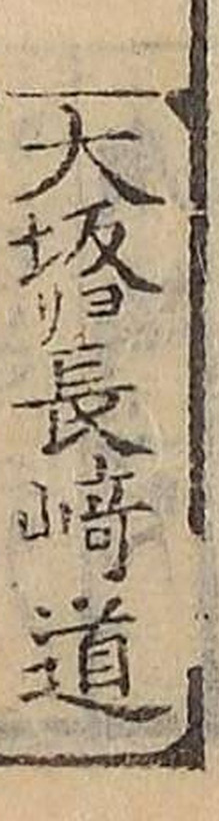大坂ヨリ長崎道
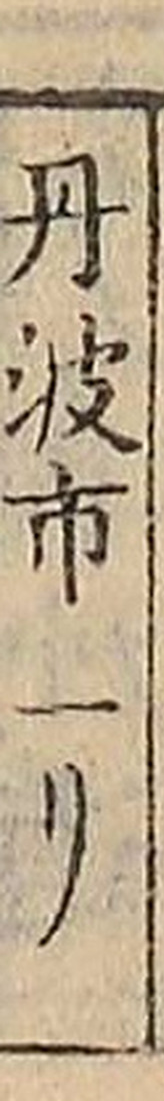丹波市一リ
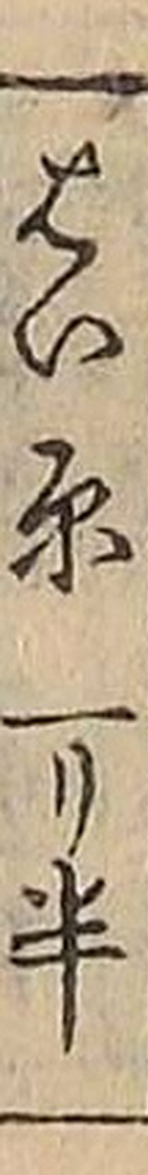はい原一リ半
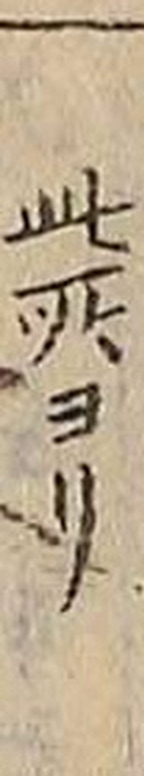此所ヨリ
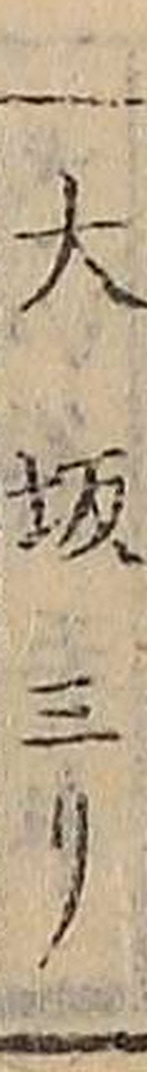大坂三リ
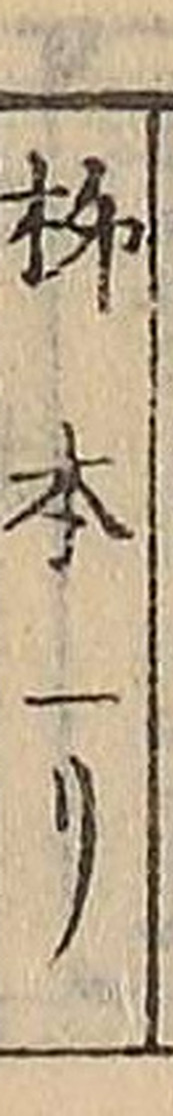柳本一リ
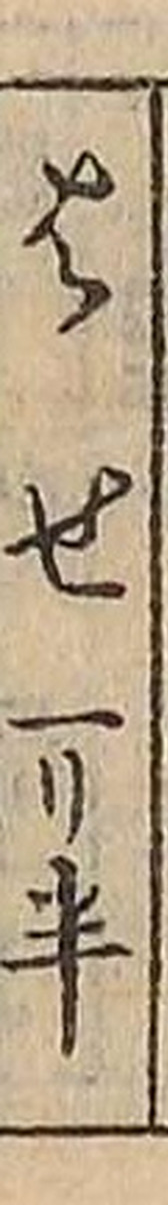はせ一リ半
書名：旅行用心集
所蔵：神戸大学附属図書館 国文学研究資料館
